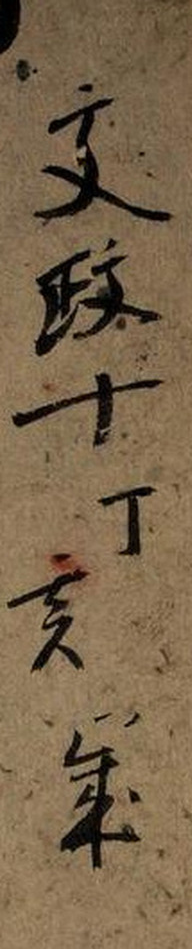文政十丁亥歳
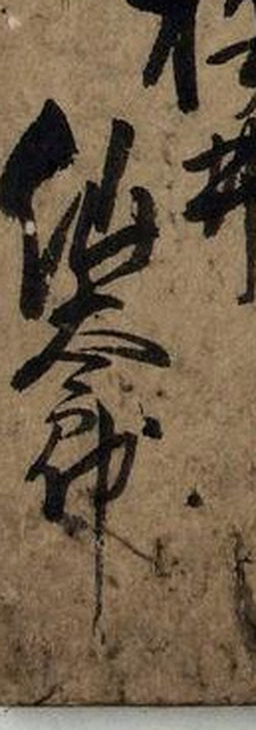仙太郎

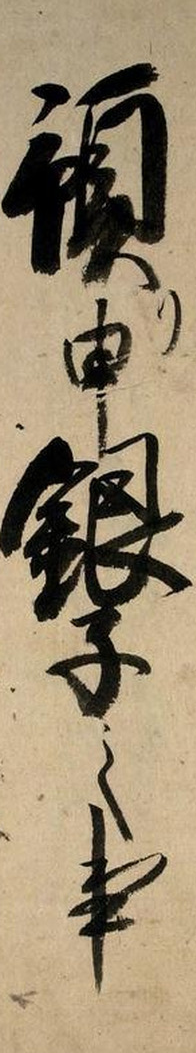預り申銀子之事
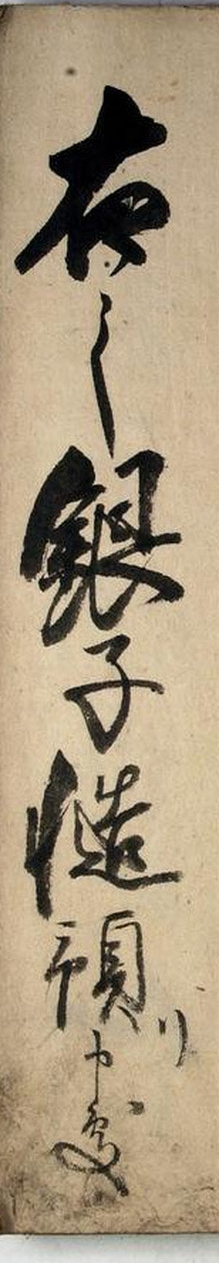右之銀子慥預り申処

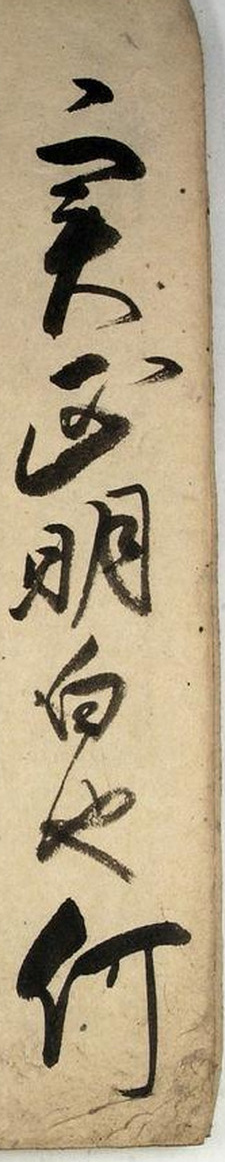実正明白也何
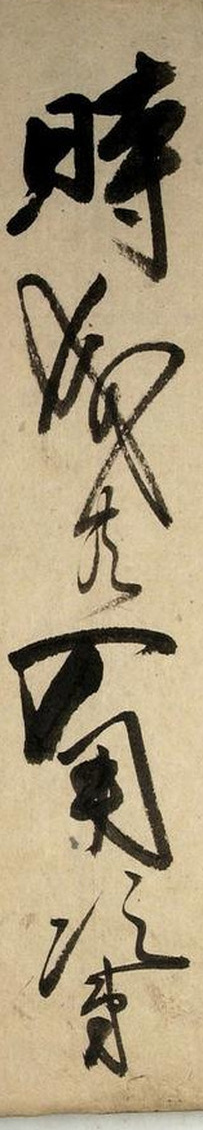時成共入用次第
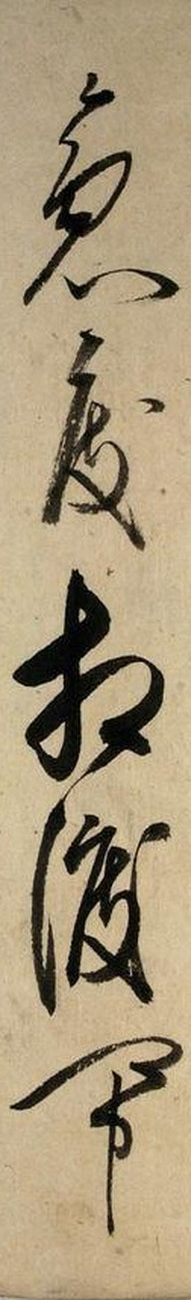急度相渡可申
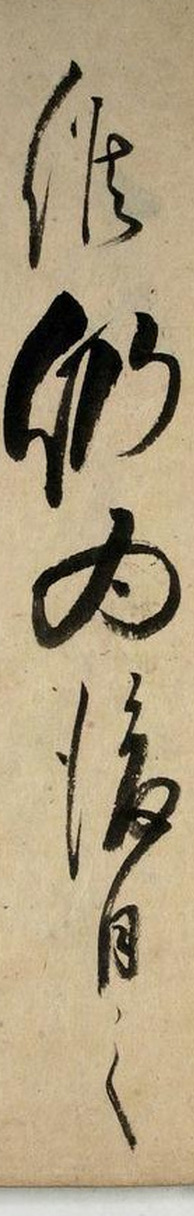候仍為後日之
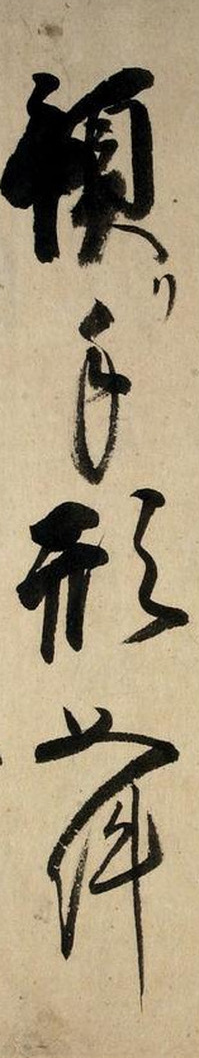預り手形如件

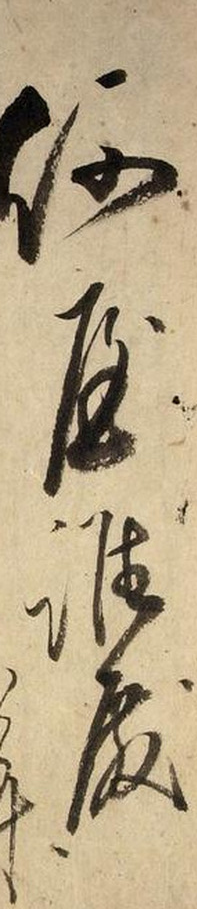何屋誰殿
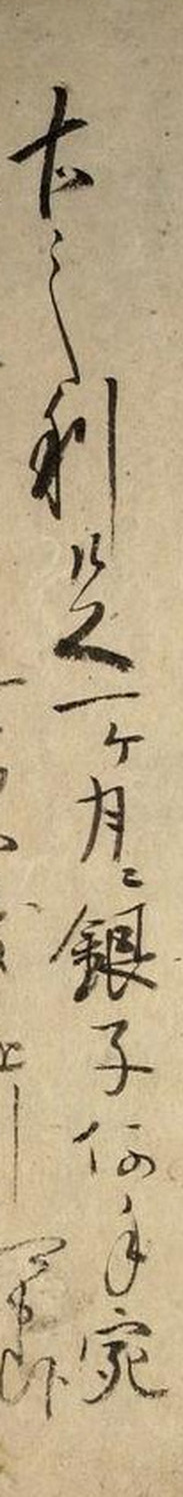右之利足一ヶ月に銀子何宛
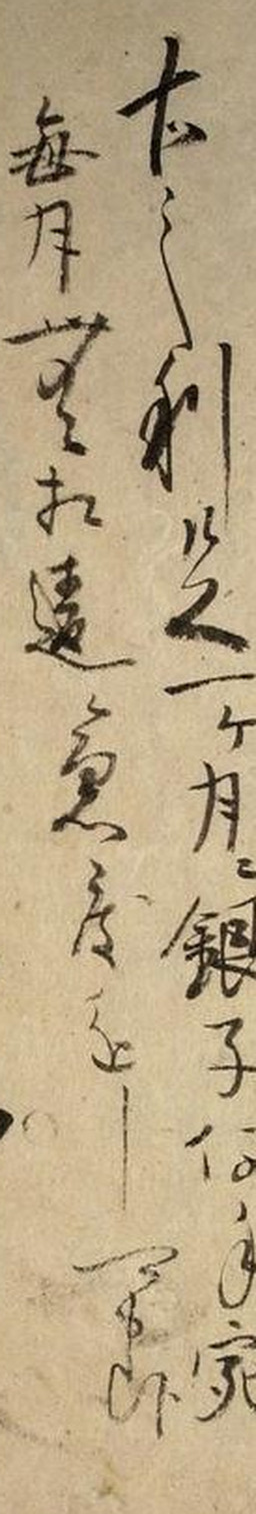毎月無相違急度返し可申候
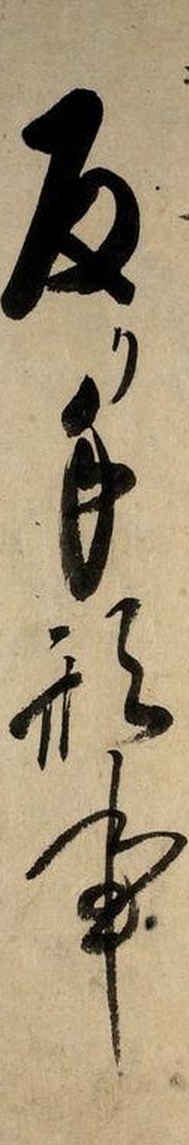反り手形事
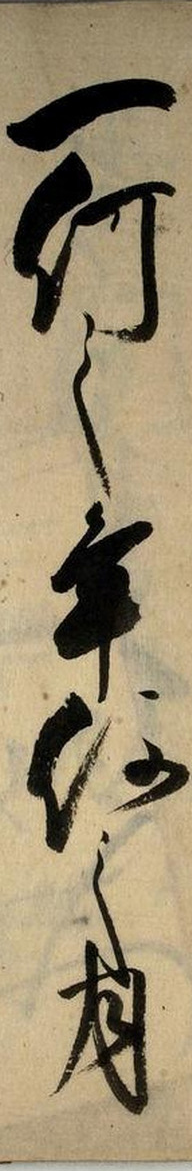一何之年何之月
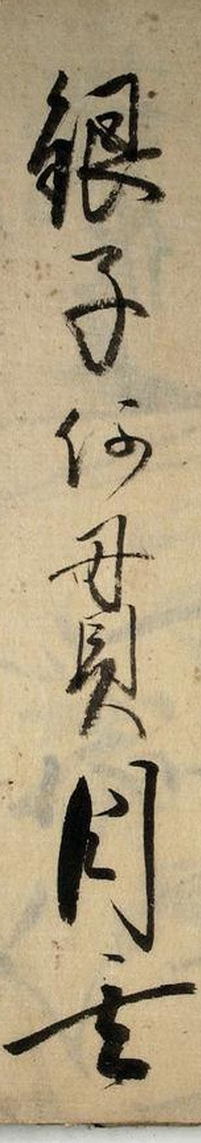銀子何貫目其
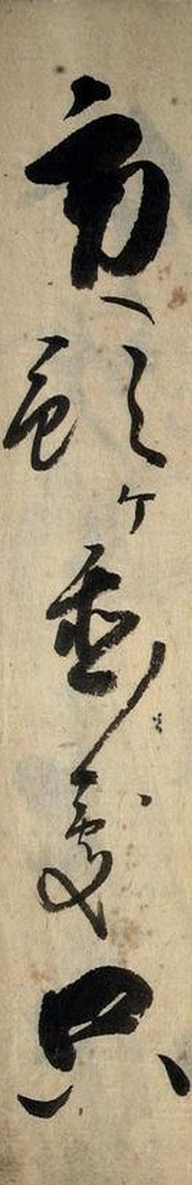方預け置候処只
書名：御手本（手習、預リ申銀子之事、売渡申家屋敷事ほか）
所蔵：福井県文書館 Fukui Prefectural Archives
